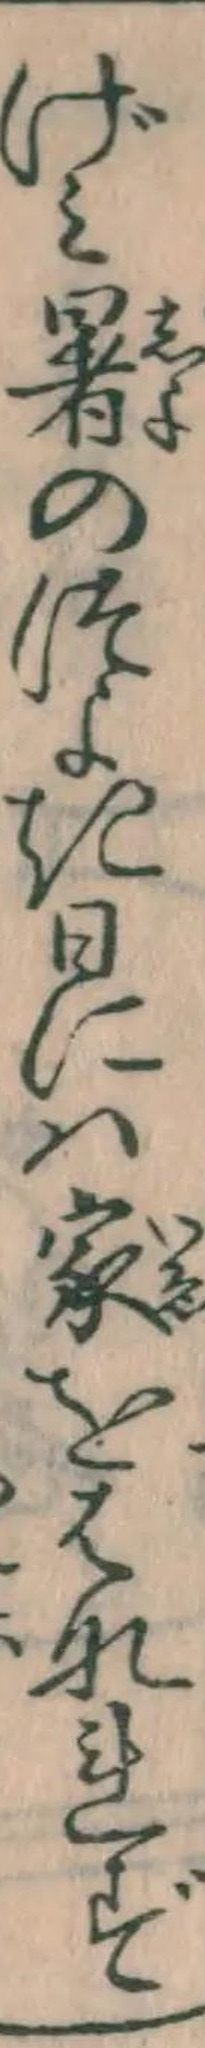げみ暑のつよき日には家をはなれず
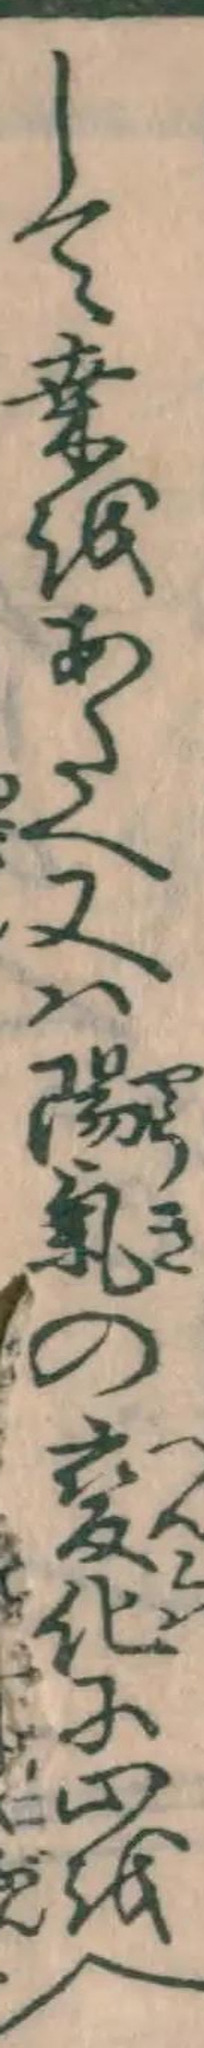して桑をあたへ又は陽気の変化に心を
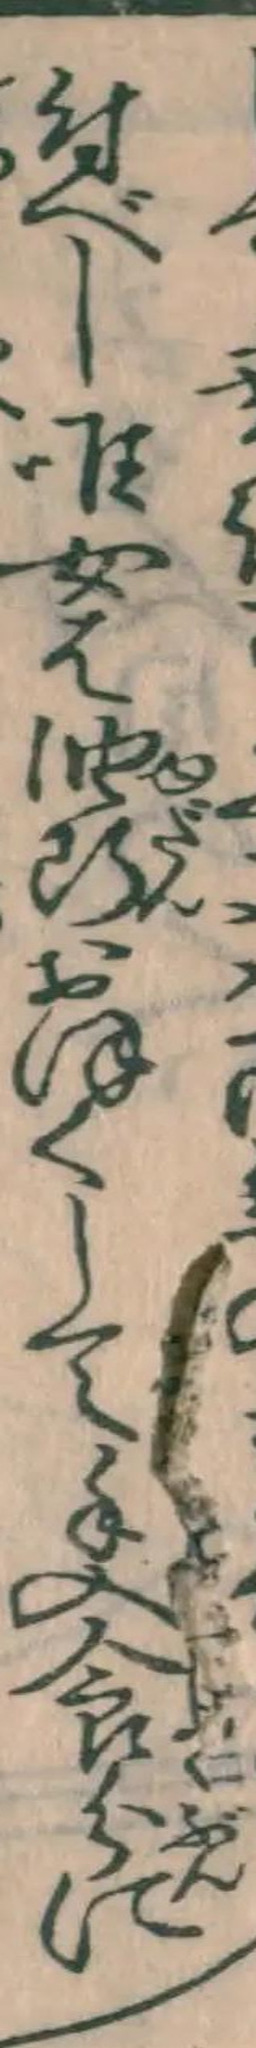付べし唯女は油断おほくして手入食分に
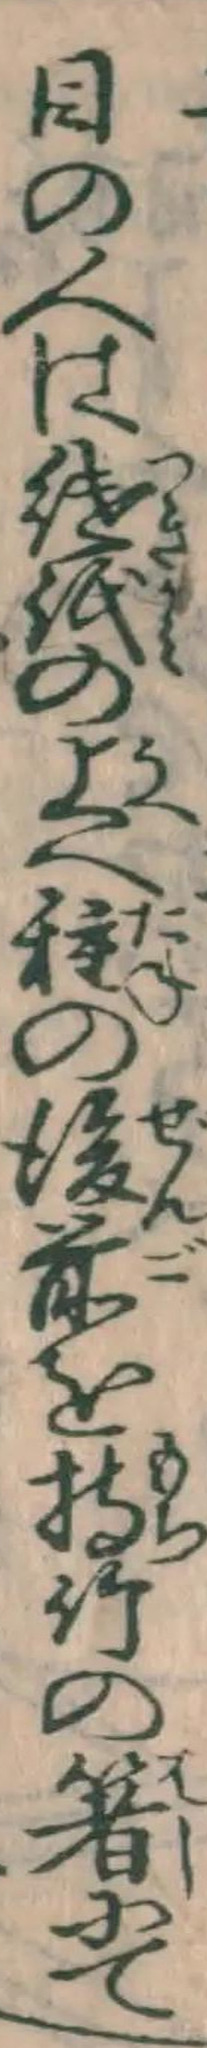目の人は継紙の上へ種の後前を持竹の箸にて
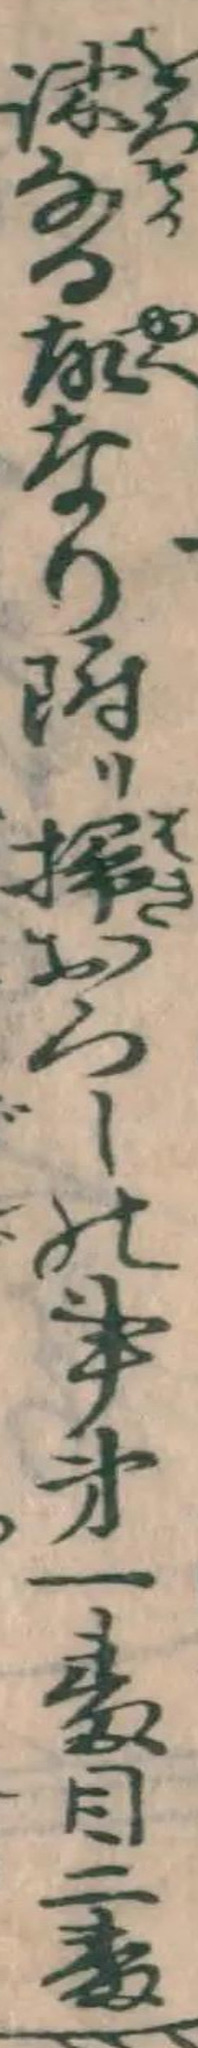疎なる故なり付掃おろしの事第一番目二番
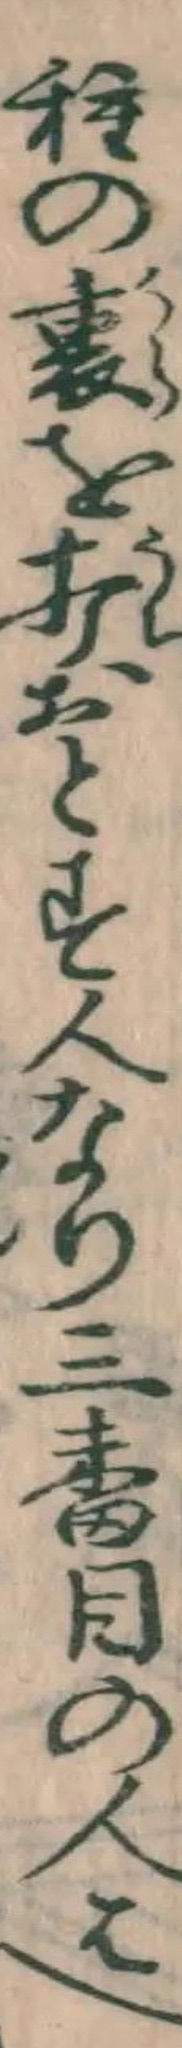種の裏を打おとす人なり三番目の人は
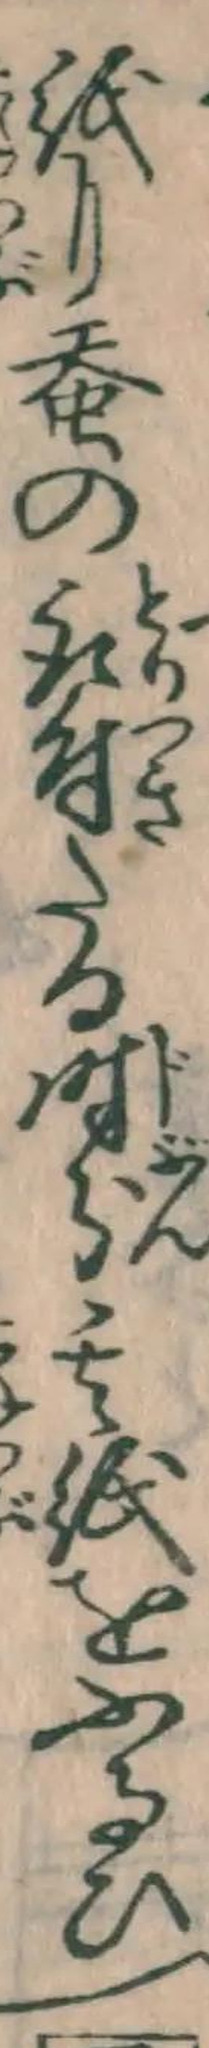紙に蚕の取付たる時分其紙をふるひ
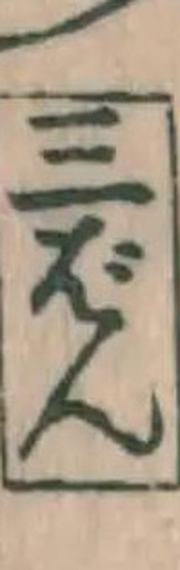三ばん
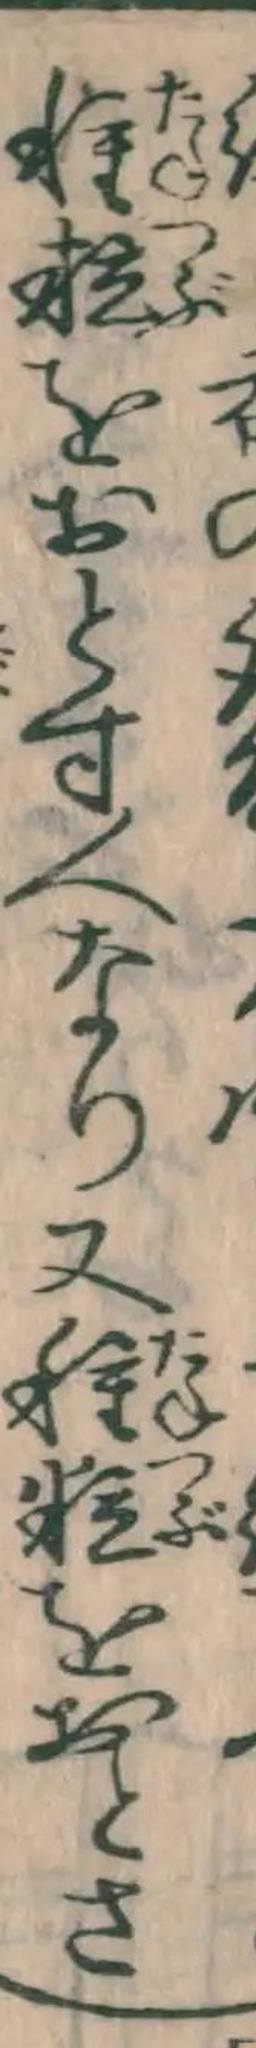種粒をおとす人なり又種粒をおとさ
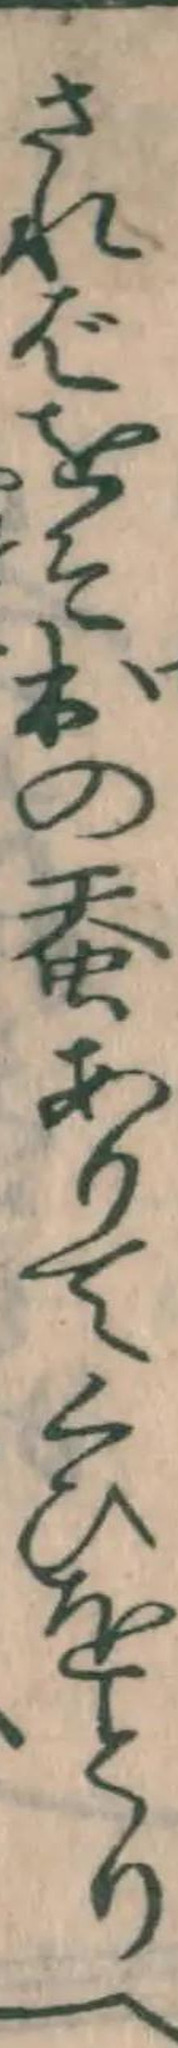さればをそ出の蚕ありてくひをとり
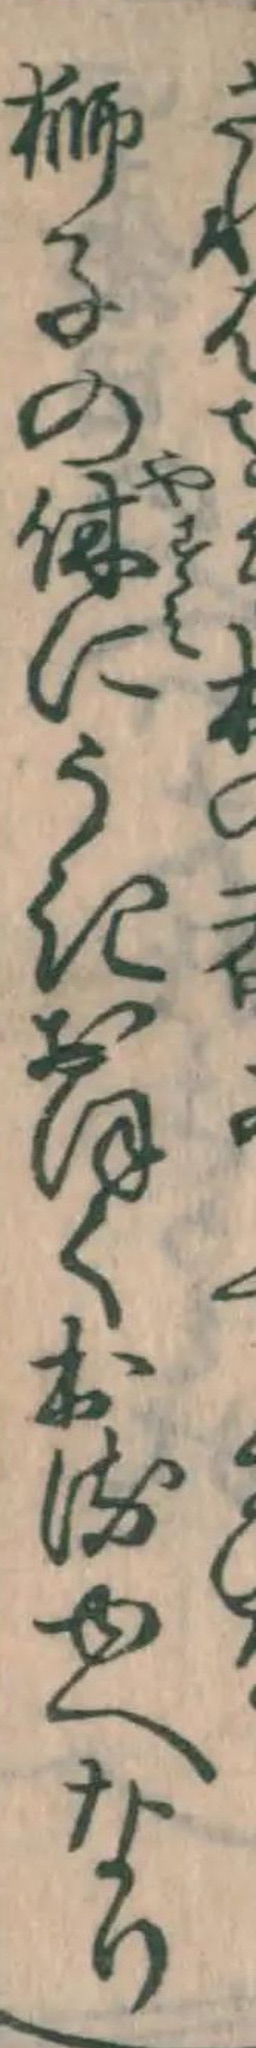獅子の休にうきおほく出るゆへなり

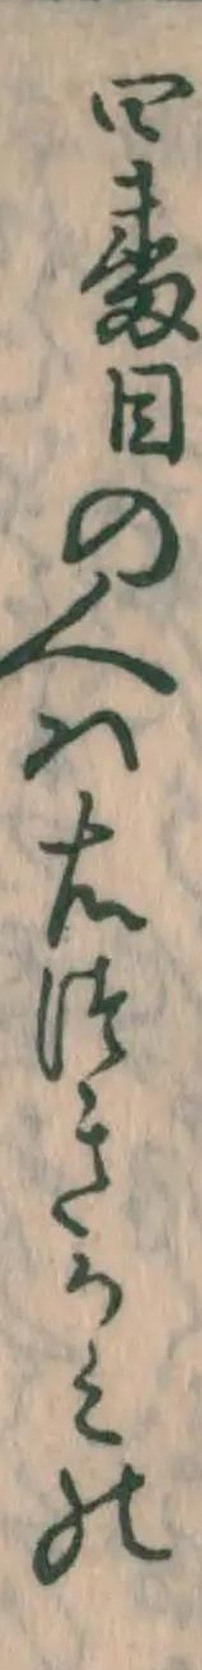四番目の人は右つきかみの
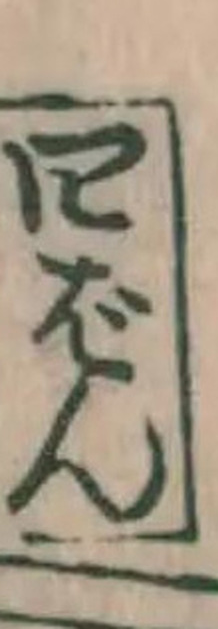四ばん
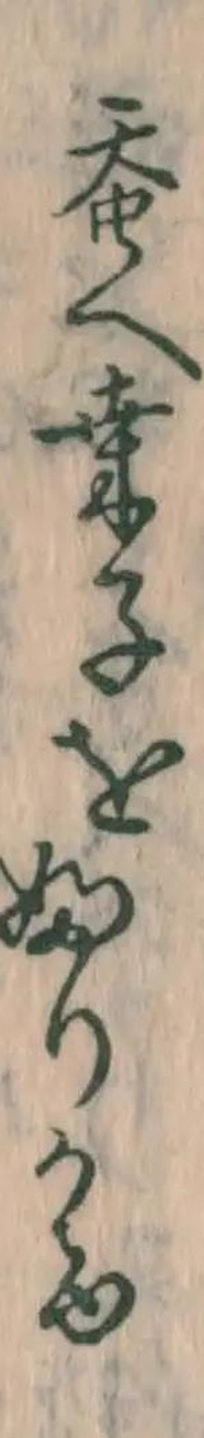蚕へ桑子をふりかけ
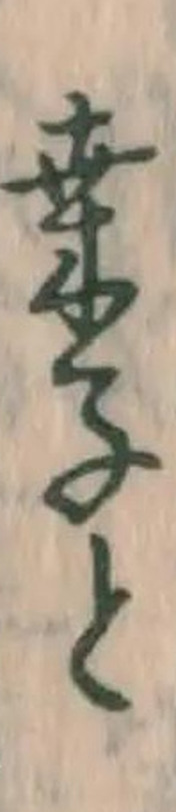桑子と
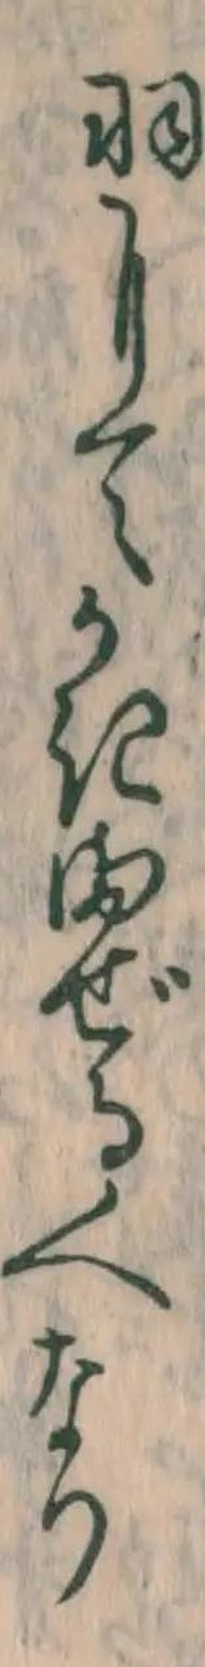羽にてかきまぜる人なり
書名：新撰養蚕秘書
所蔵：国立国会図書館 National Diet Library, JAPAN
